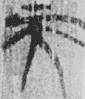天
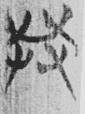共
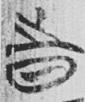○（時）
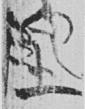地
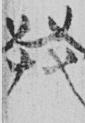共
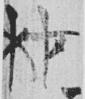材
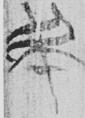民
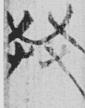共
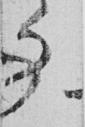力
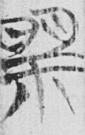○（明）
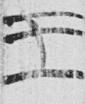王
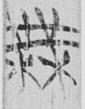無
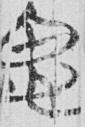思
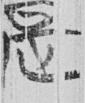是
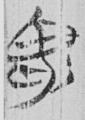{胃刀}（謂）
